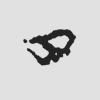日
